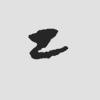鳦
